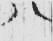八
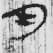月
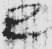己
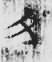丑
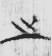之
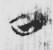日
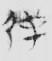○（射）
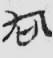叴
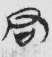君
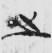之
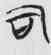司
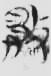敗
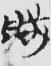戕
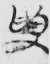受
